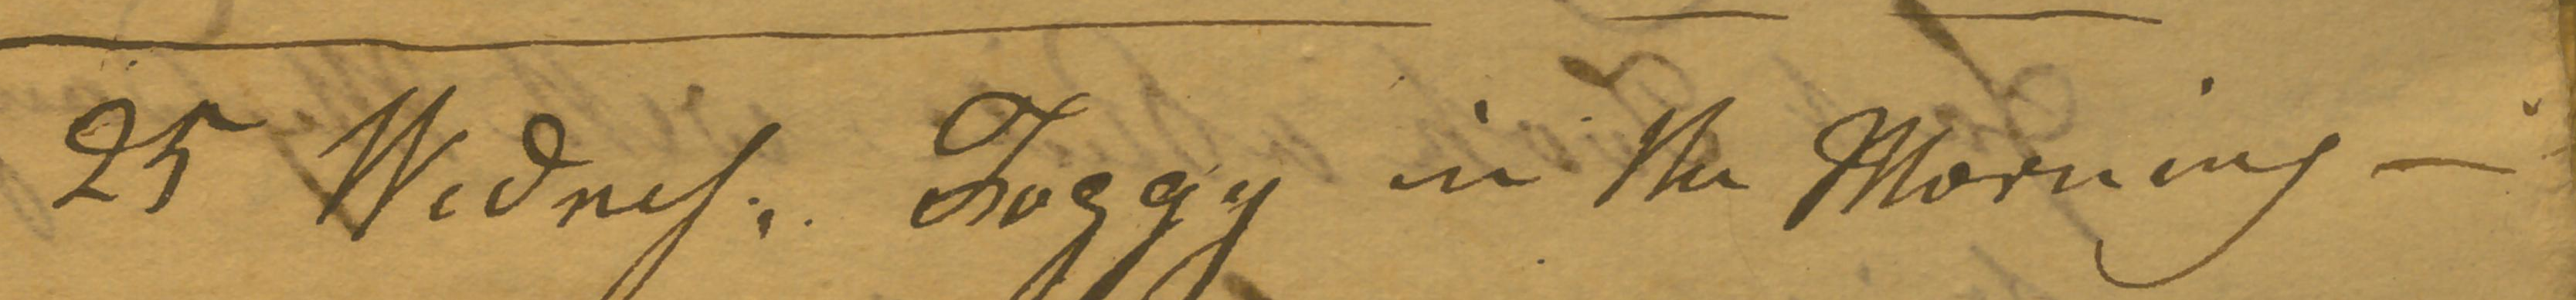25 Wednes. Foggy in the Morning-
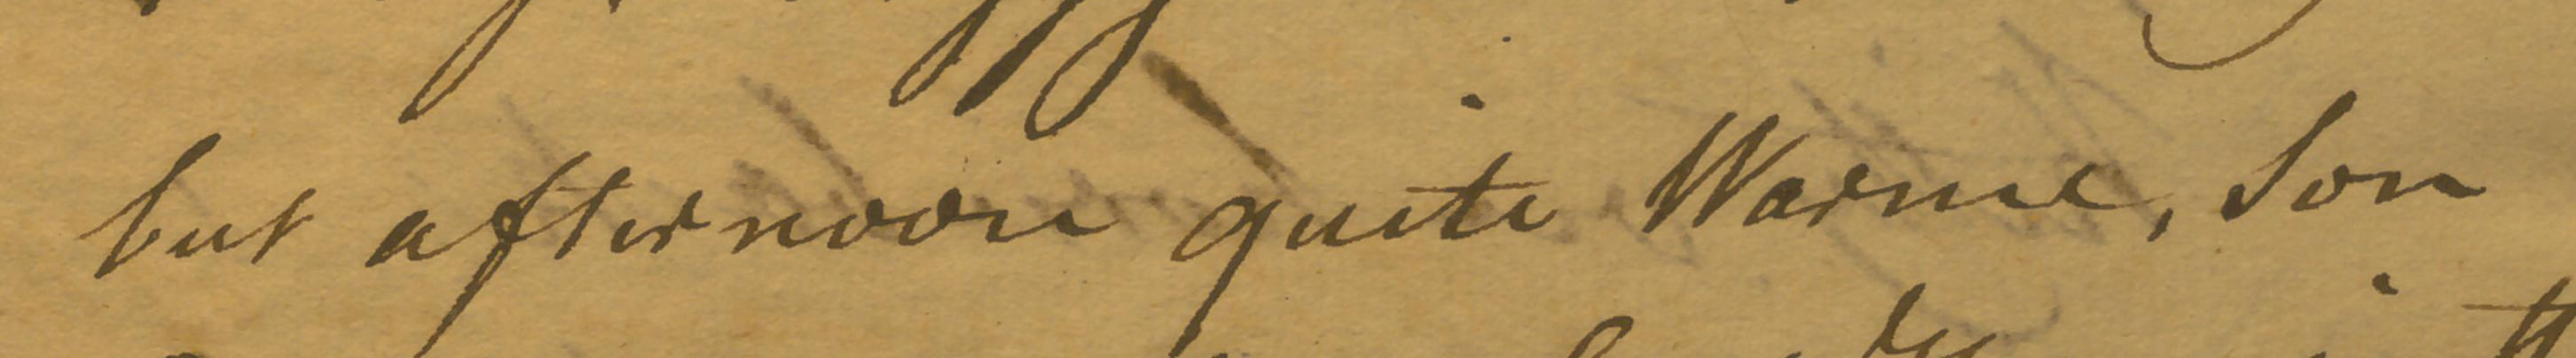but afternoon quite Warme, Son
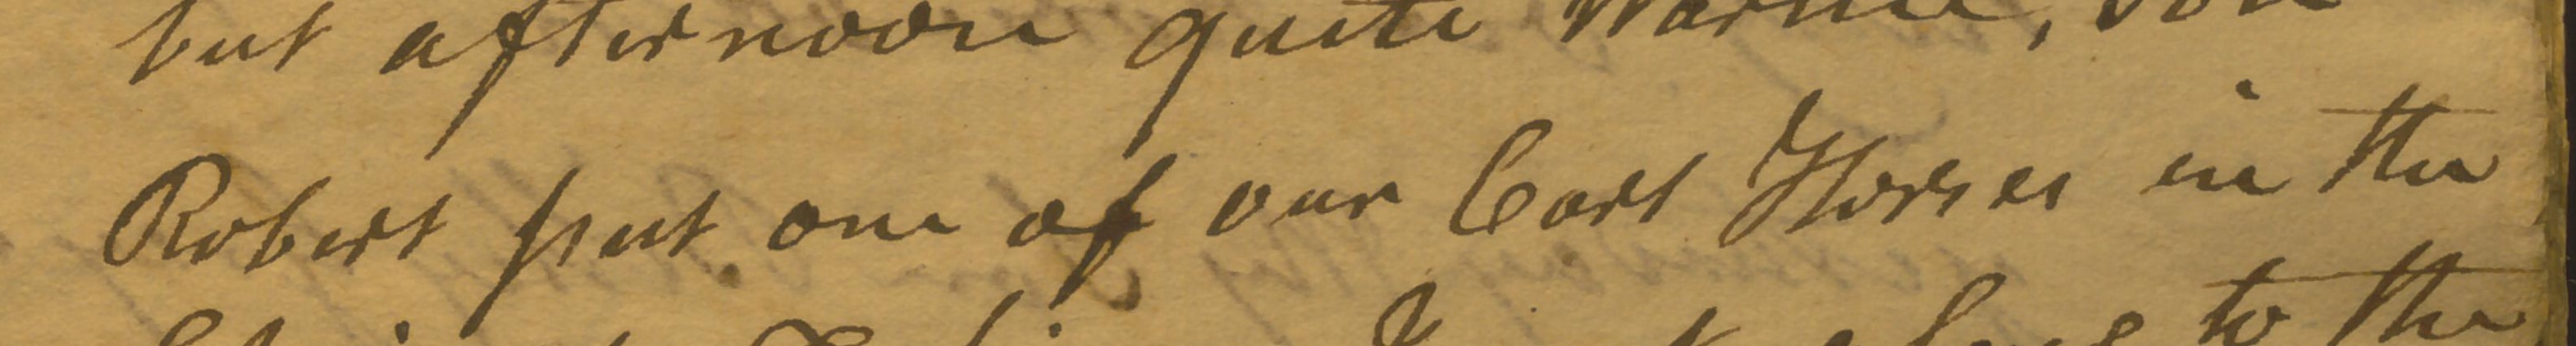Robert put one of our Cart Horses in thee
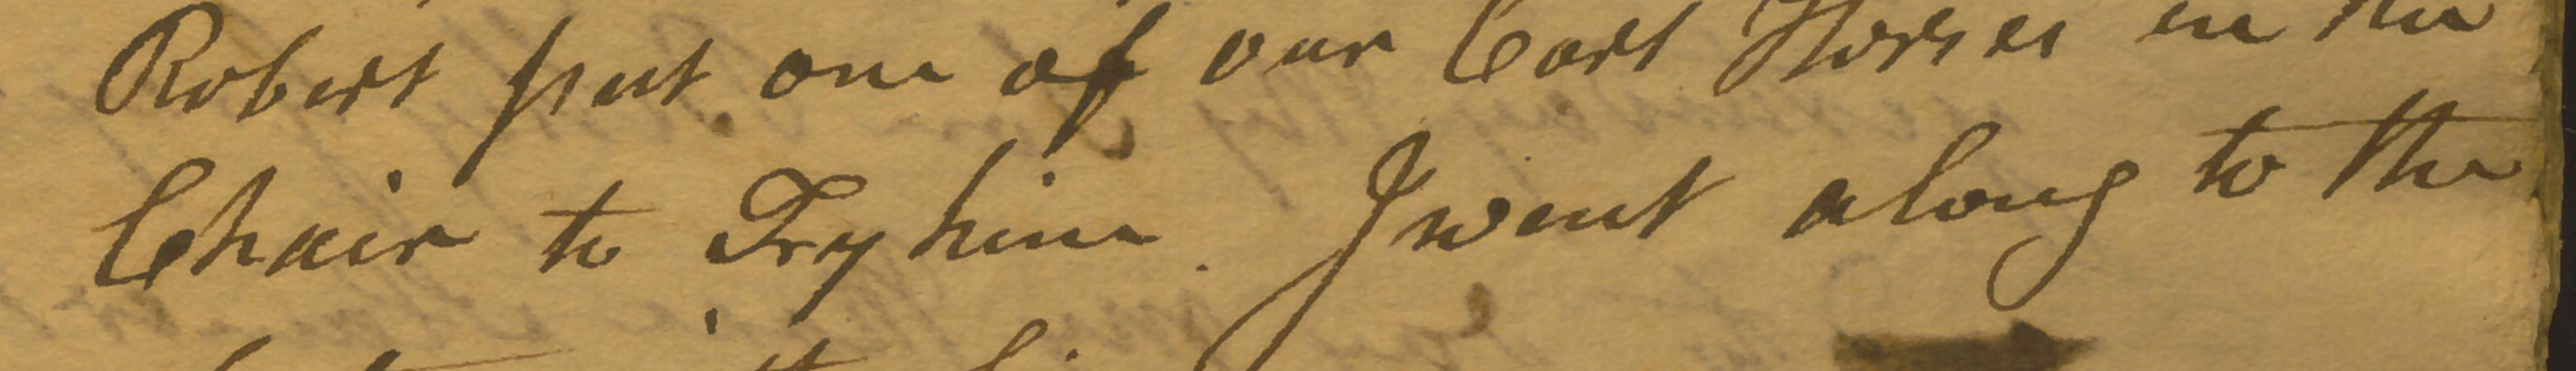Chair to Try him I went along to the
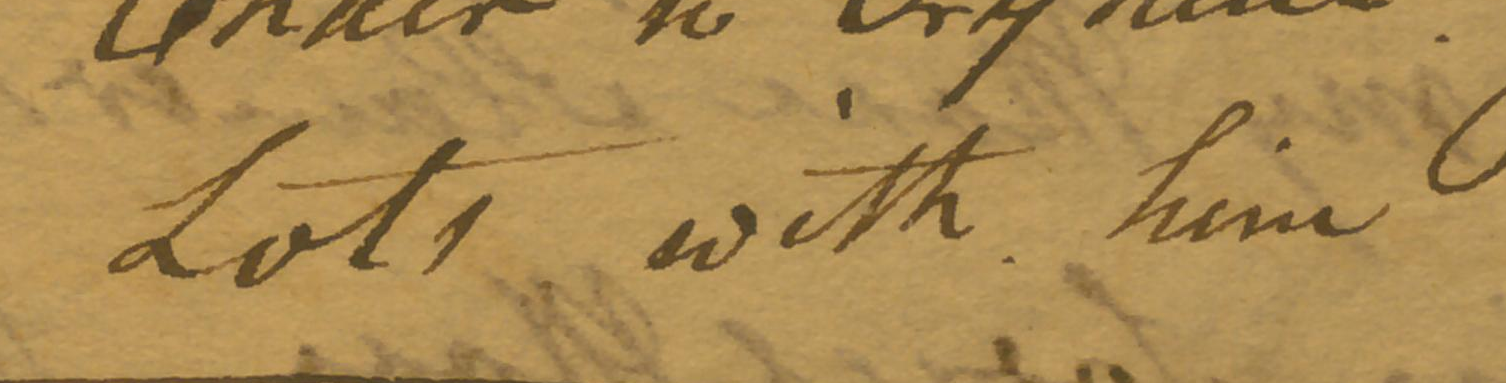Lots with him
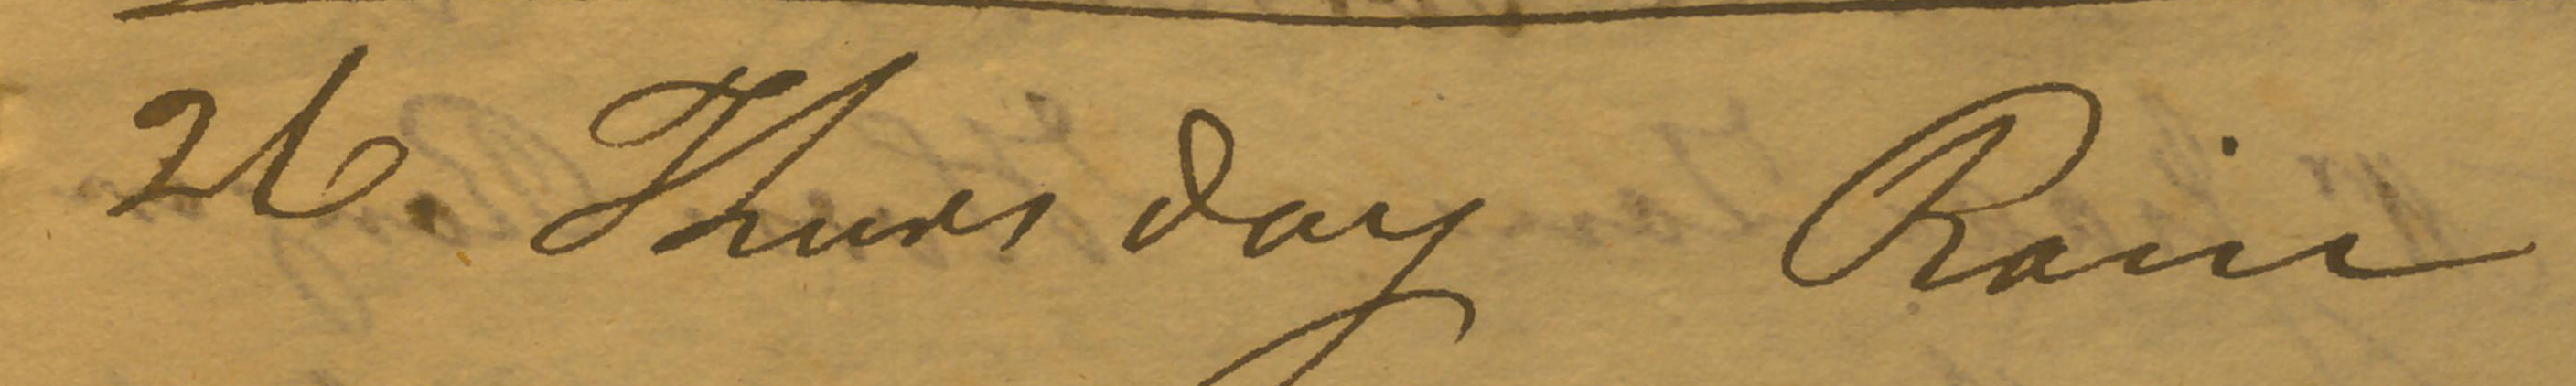26. Thursday Rain
